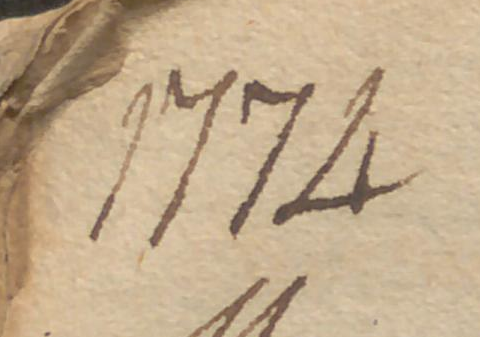1774
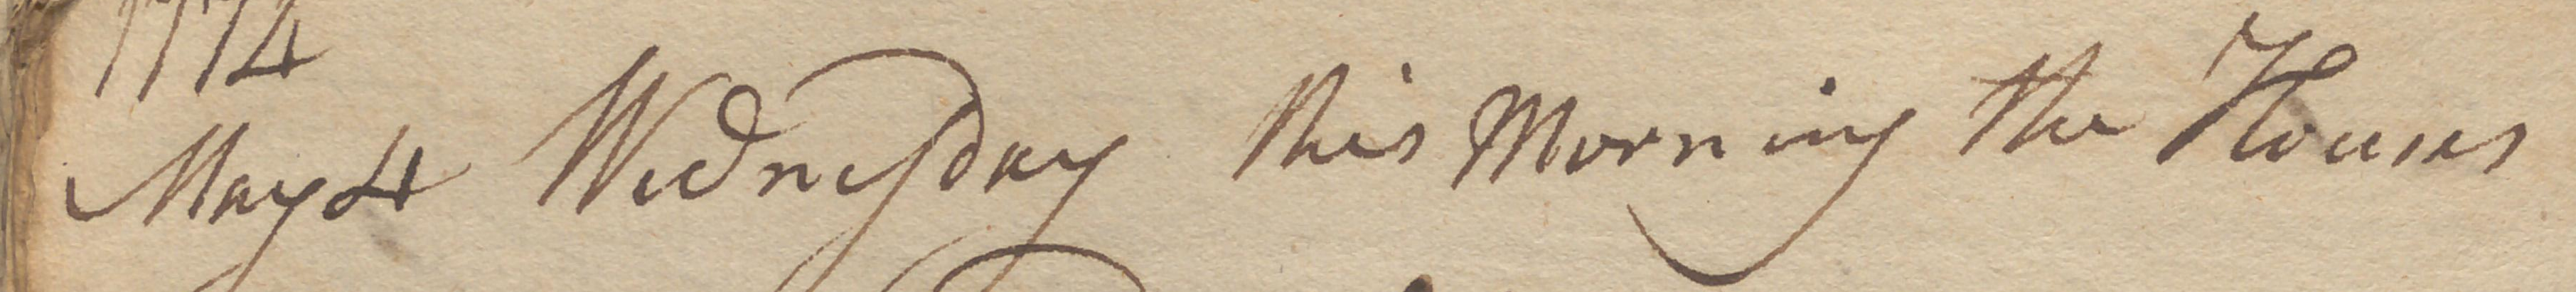May 4 Wednesday this Morning the Houses
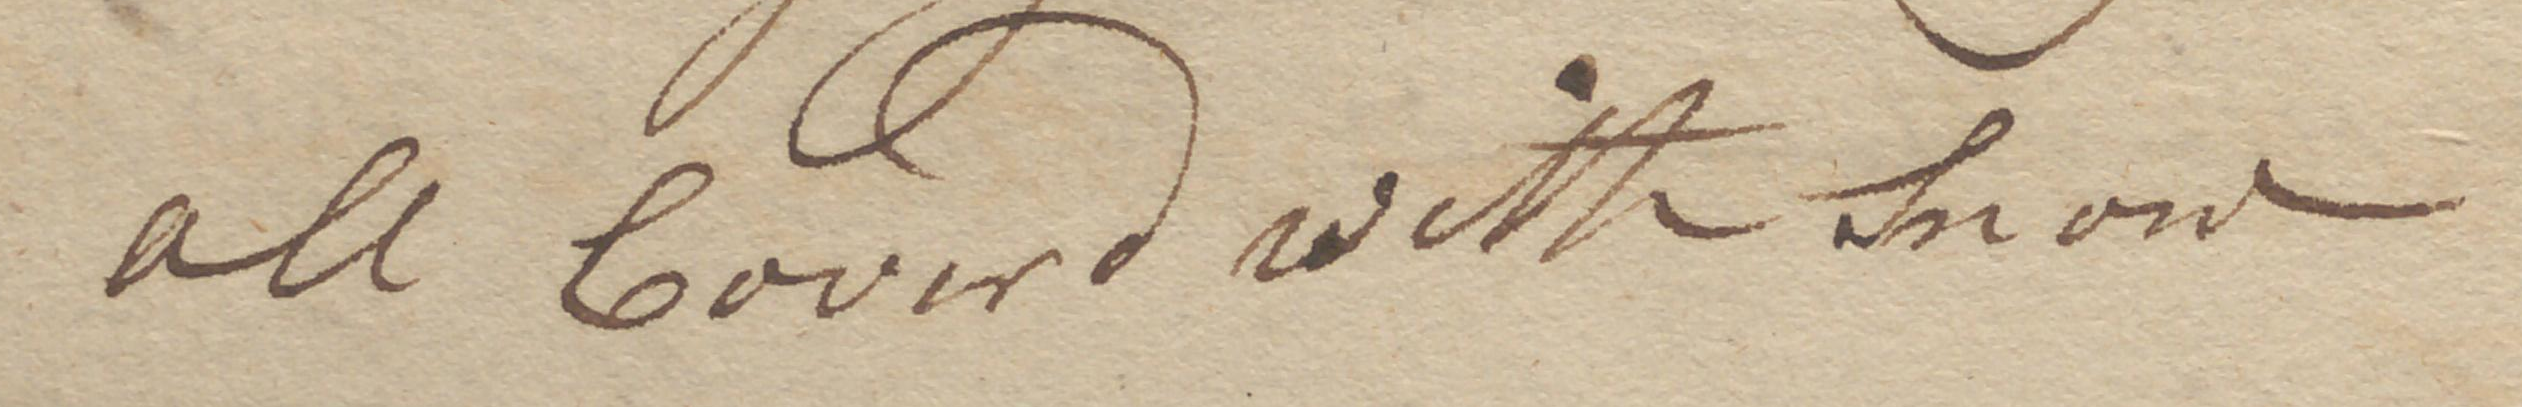all Coverd with snow
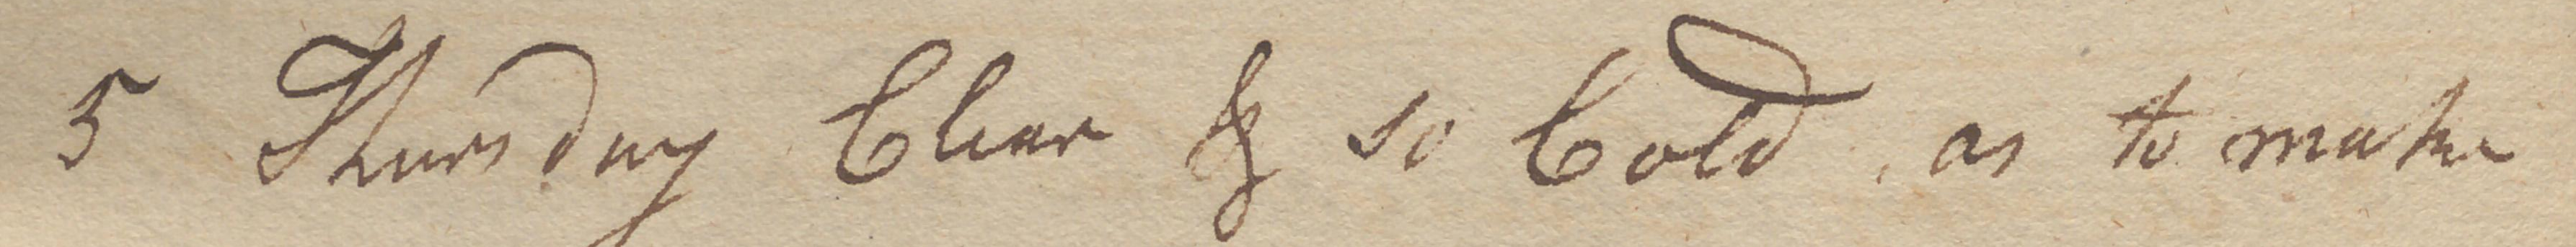5 Thursday Clear & so Cold, as to make
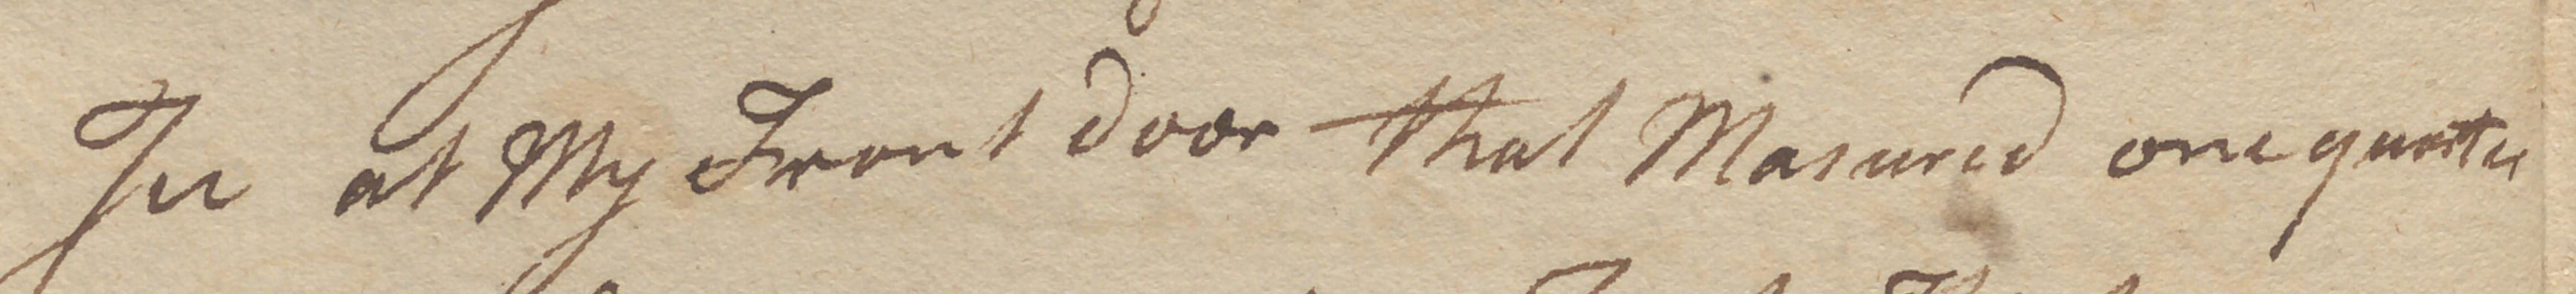Ice at My Front door that Masured one quarter
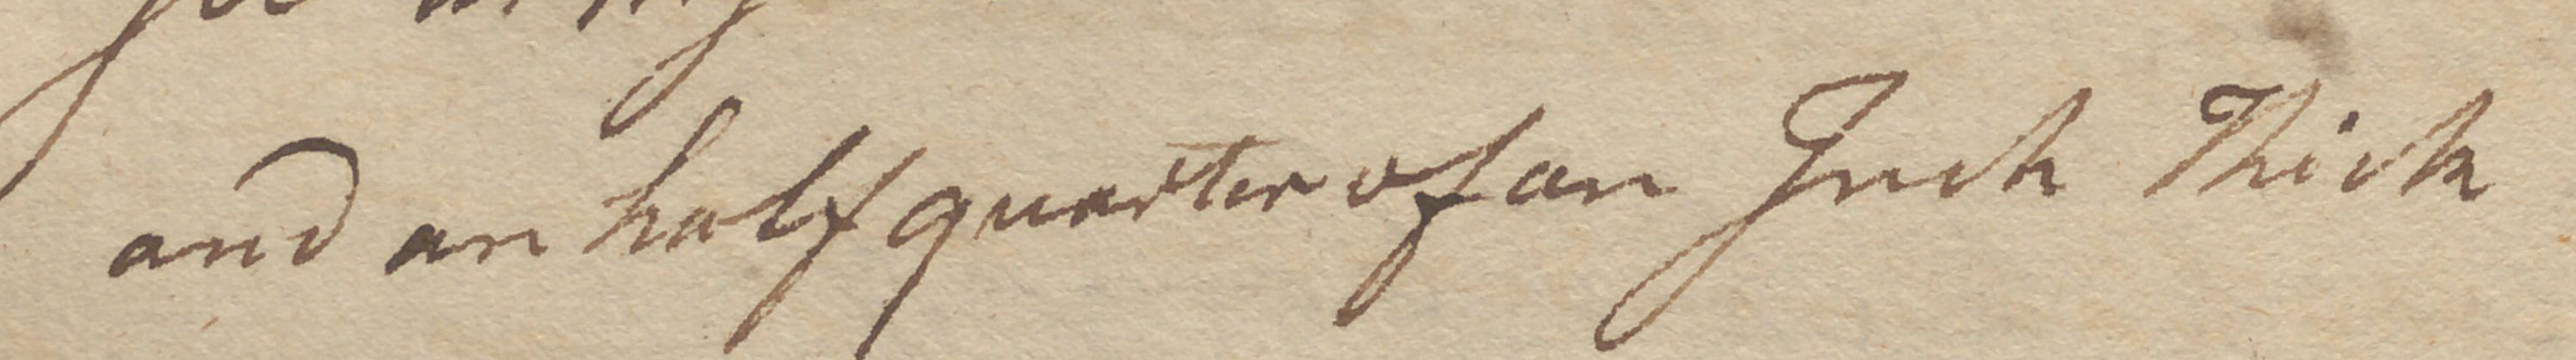and an half quarter of an Inch Thick
